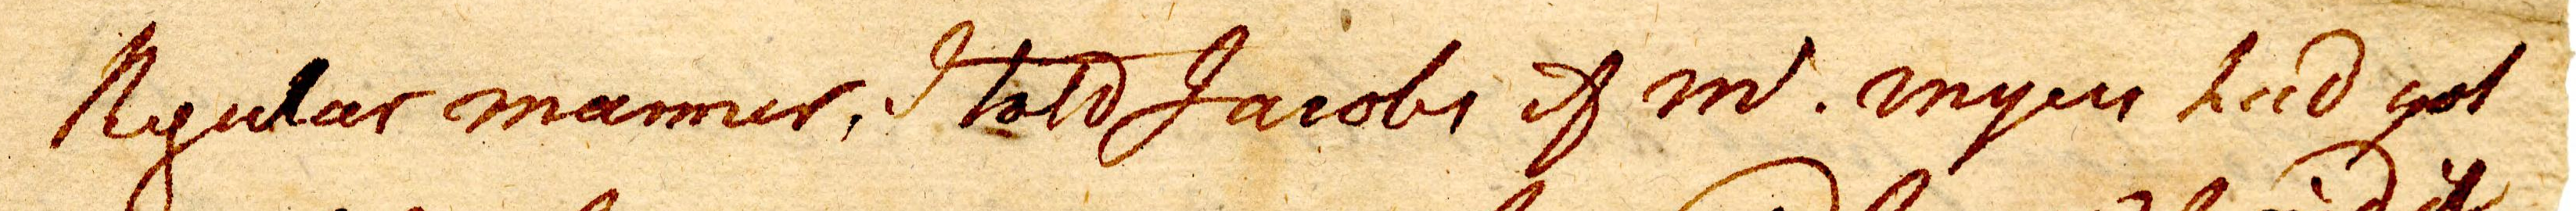Regular manner I told Jacobs if M^r. Myers had got
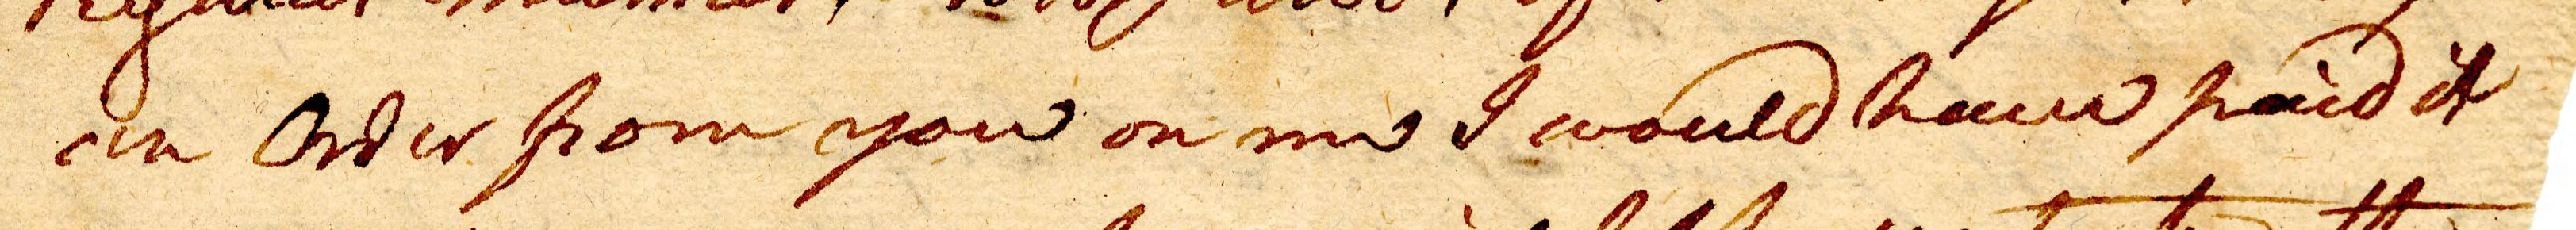any order from you on me I would have paid it
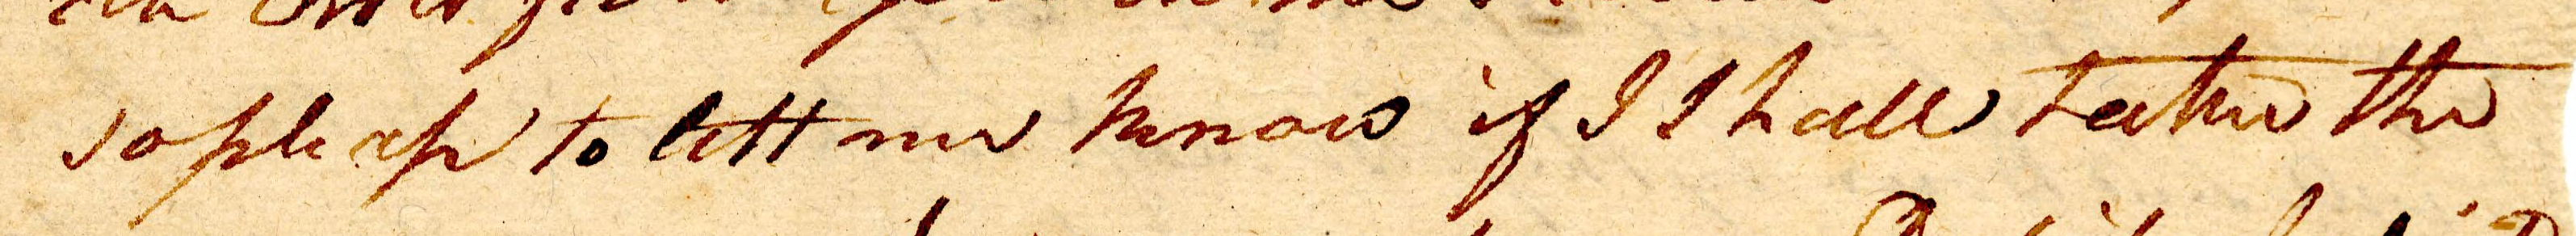so please to lett me know if I shall take the
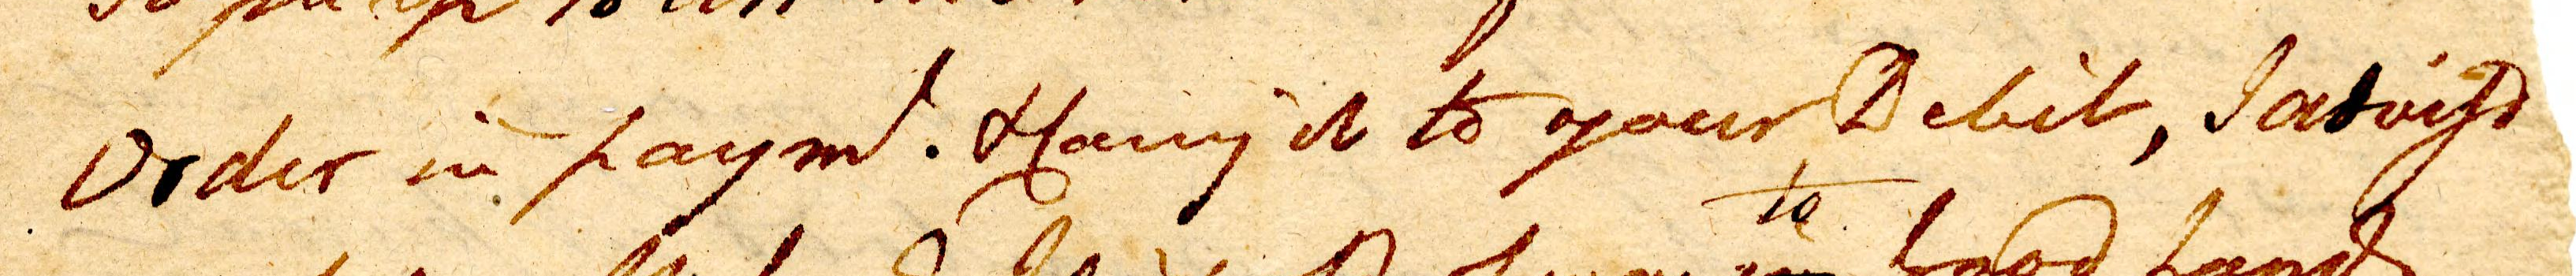Order in paym^t. & carry it to your Debit, I advisd
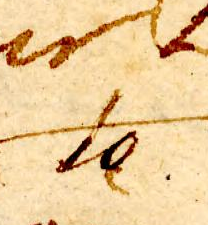to
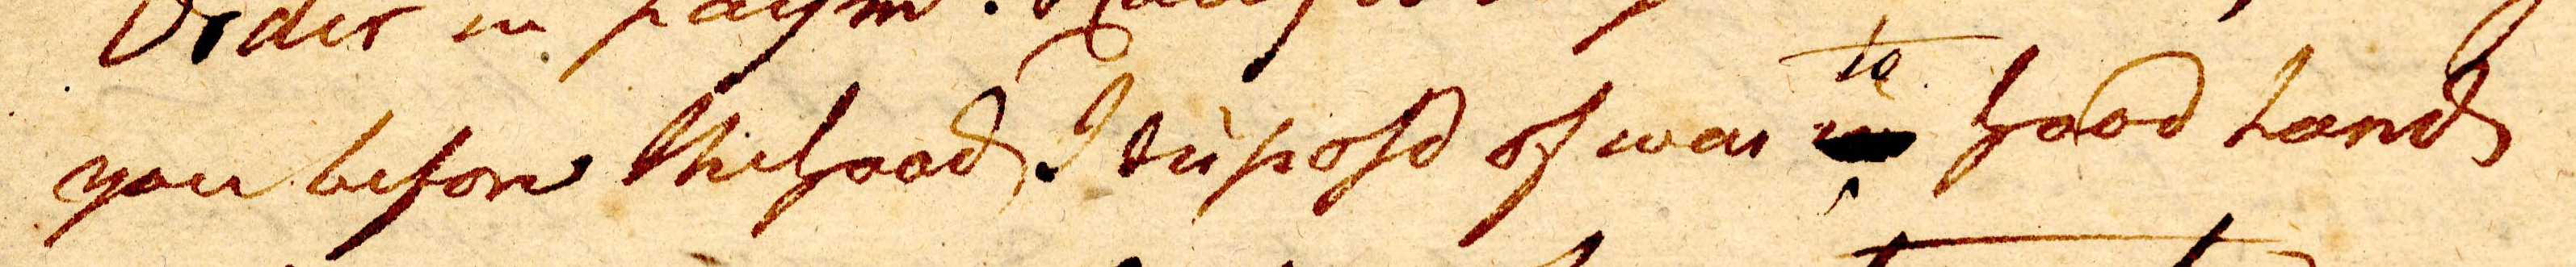you before the good, I suposd of was ^ [_] good hands
